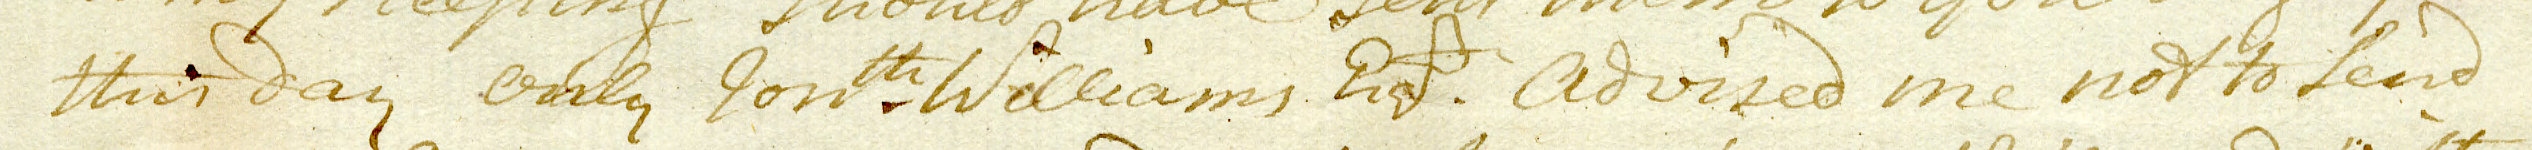this day only Jon^th. Williams Es^r. Advised me not to Lend
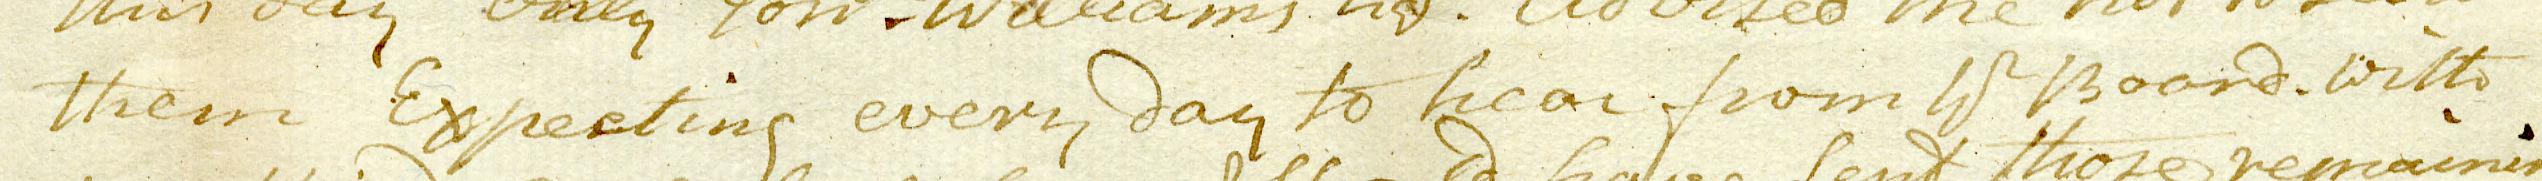them Expecting every day to hear from y^e Board. With
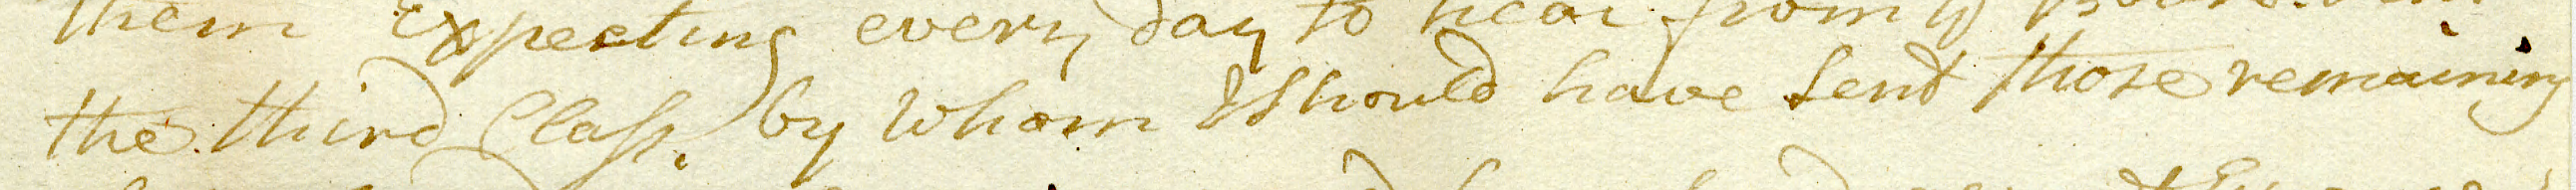the third Class by whom I should have Sent those remaining
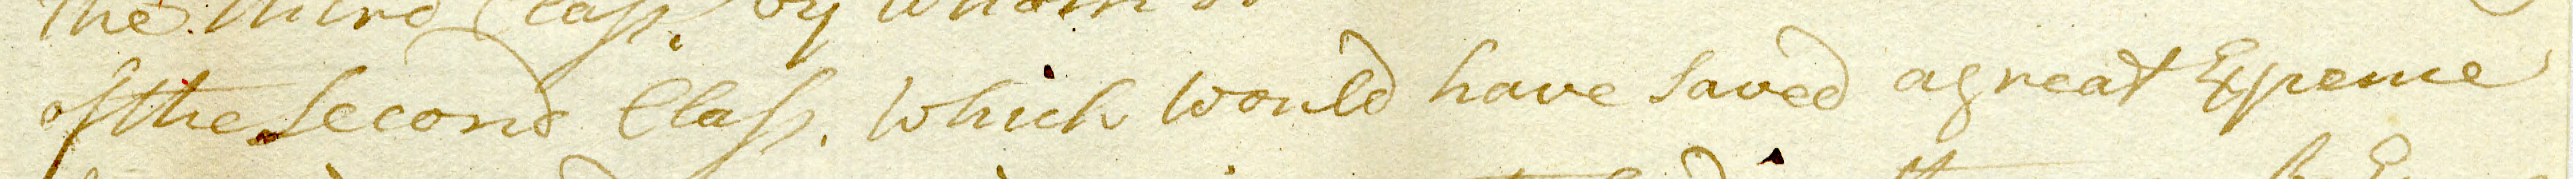of the Second Class. Which would have saved a great Expence
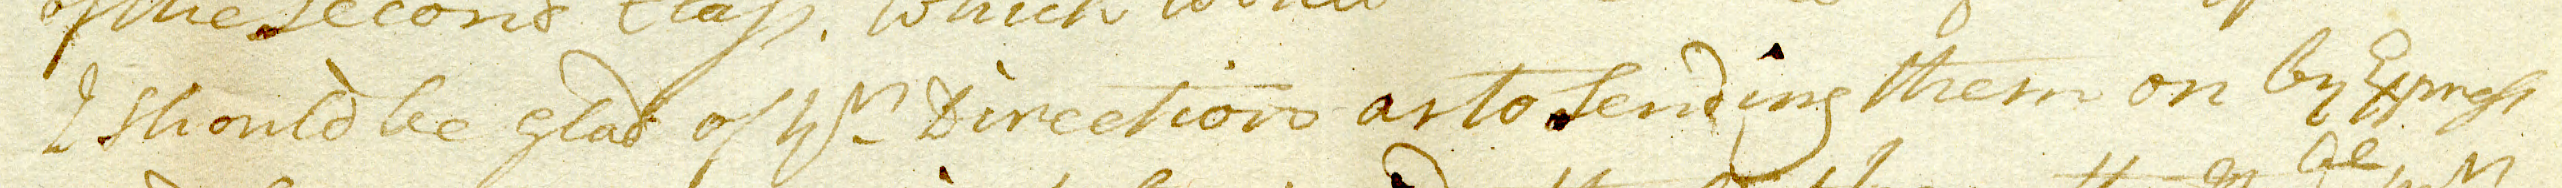I should be glad of y^r. Direction onto sending them on by Express
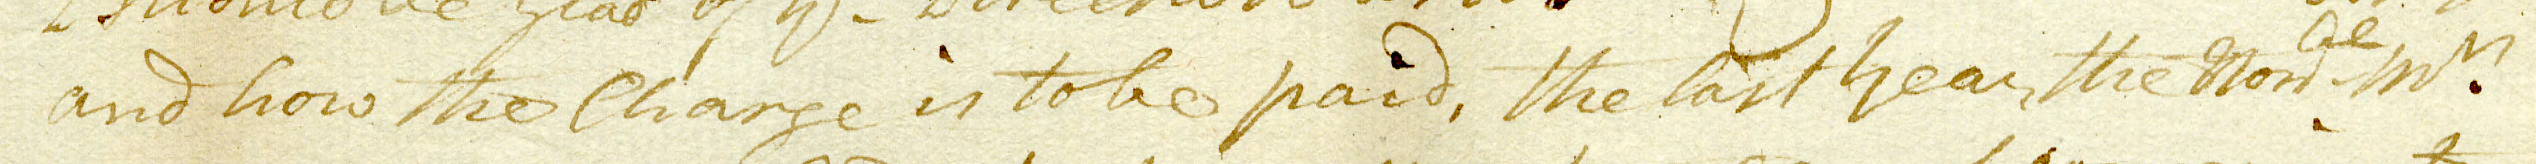and how the charge is to be paid, the last hear the Hon^be. M^r
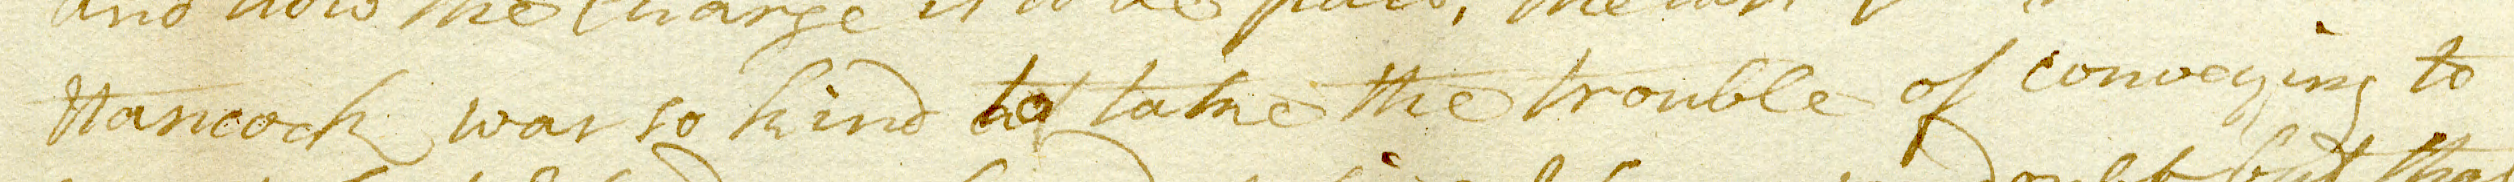Hancock was so kind to take the trouble of conveying to
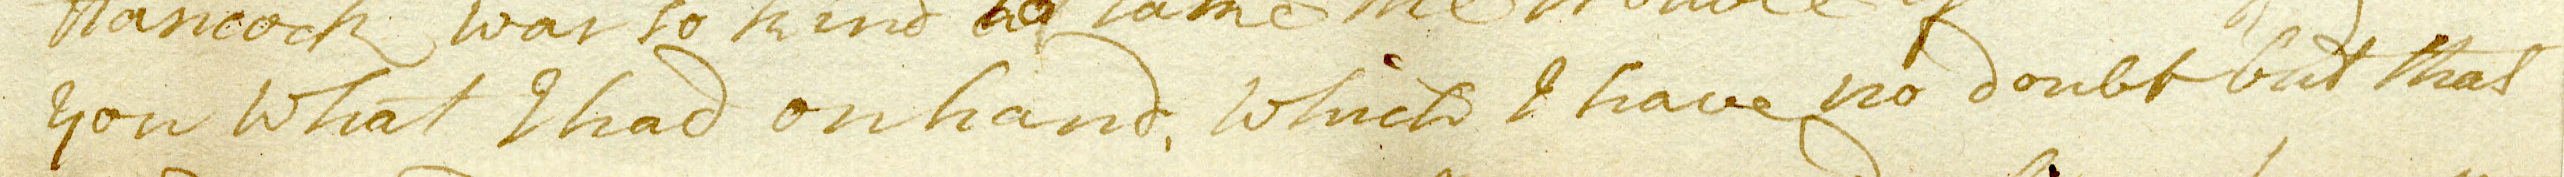you what I had on hand. Which I have no doubt but that
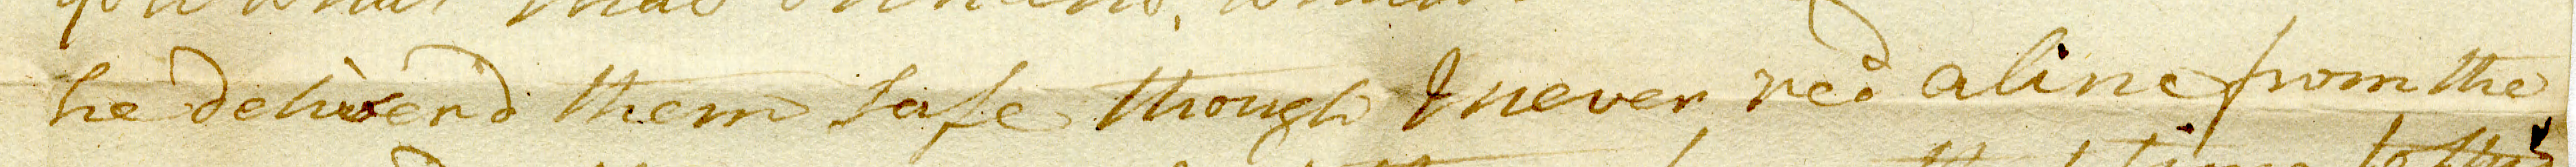he delivered them safe though I never rec^d. a line from the
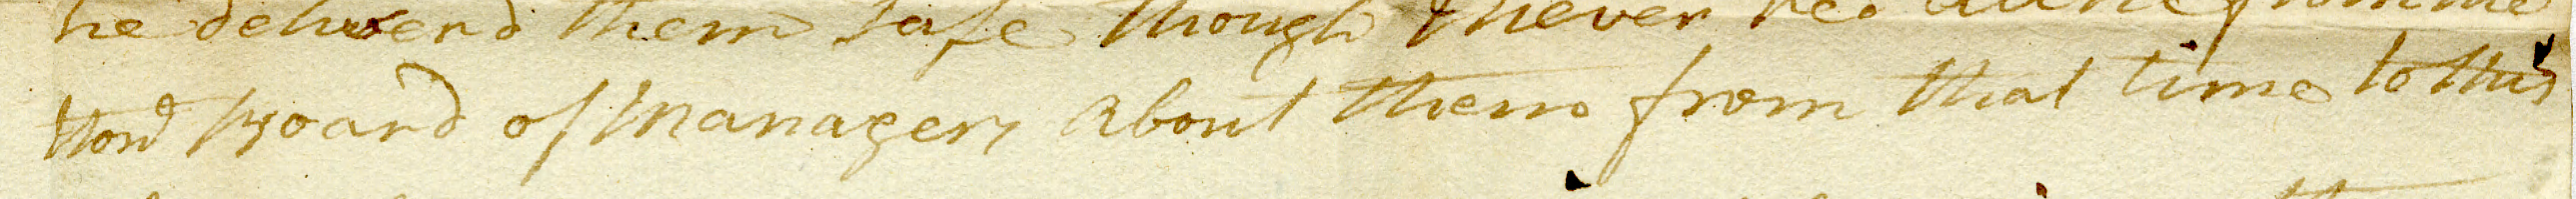Hond Board of Managers about them from that time to this
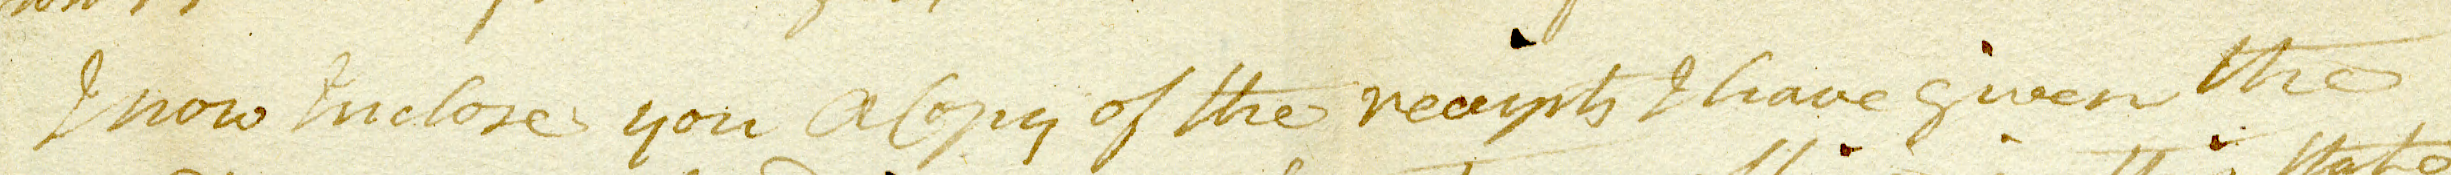I now enclose you a copy of the receipts I have given the
